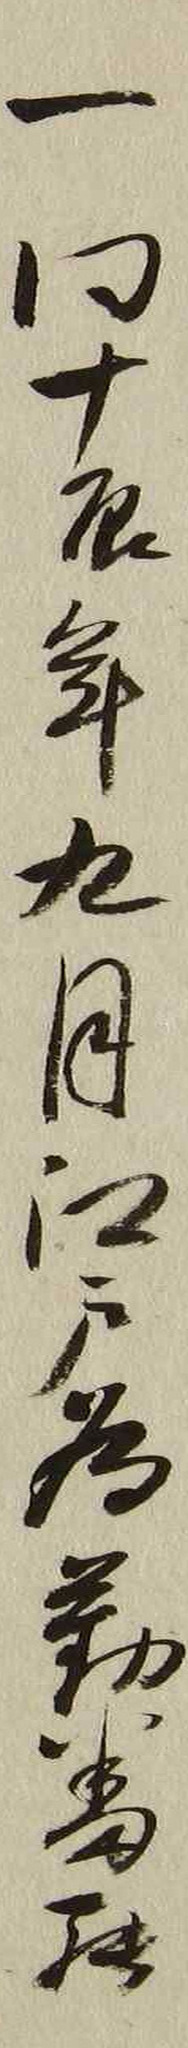一同十辰年九月江戸為勤番罷
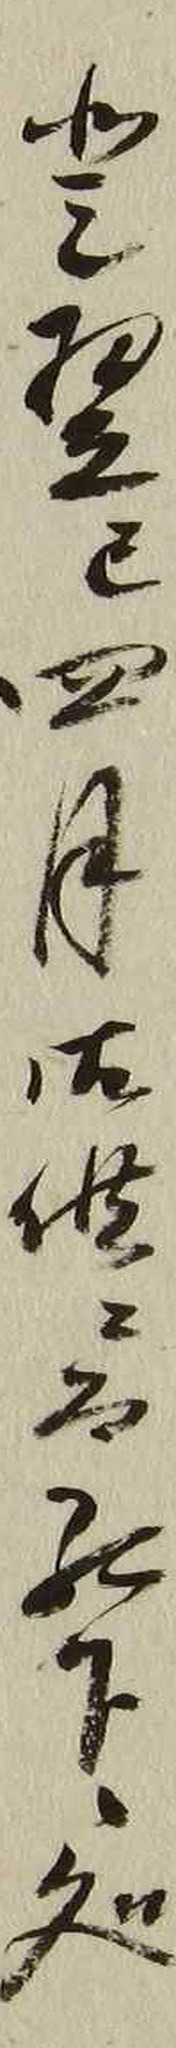登翌巳四月御供ニ而罷下候処
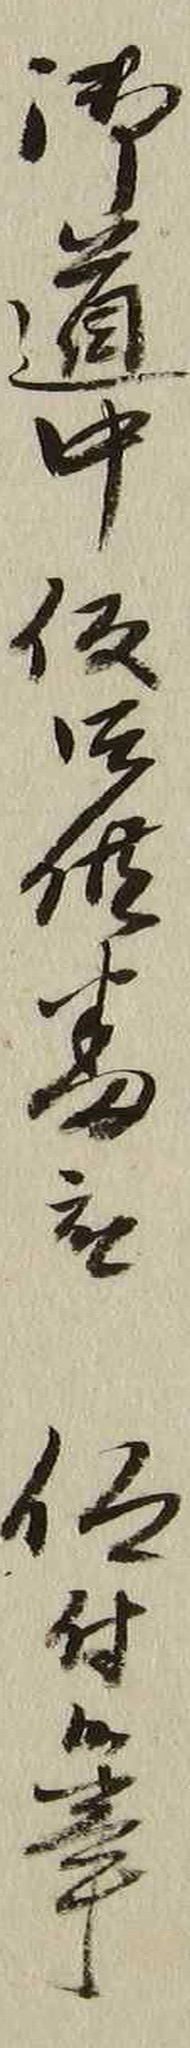御道中仮御供番被仰付候事
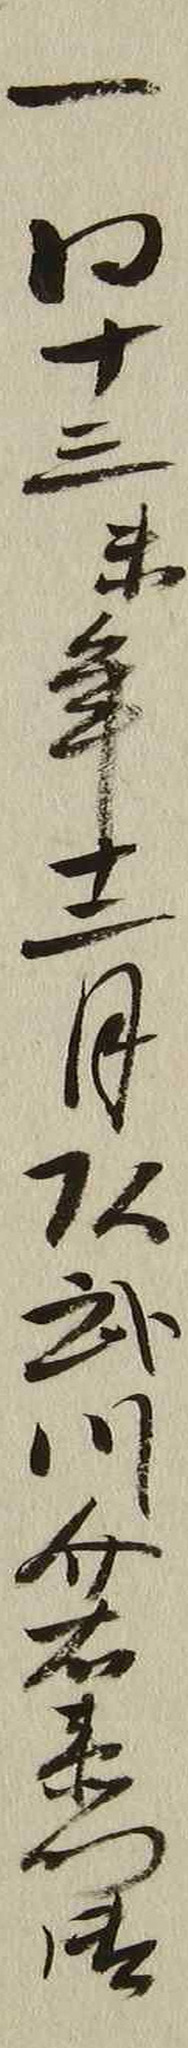一同十三未年十二月頭武川介右衛門御
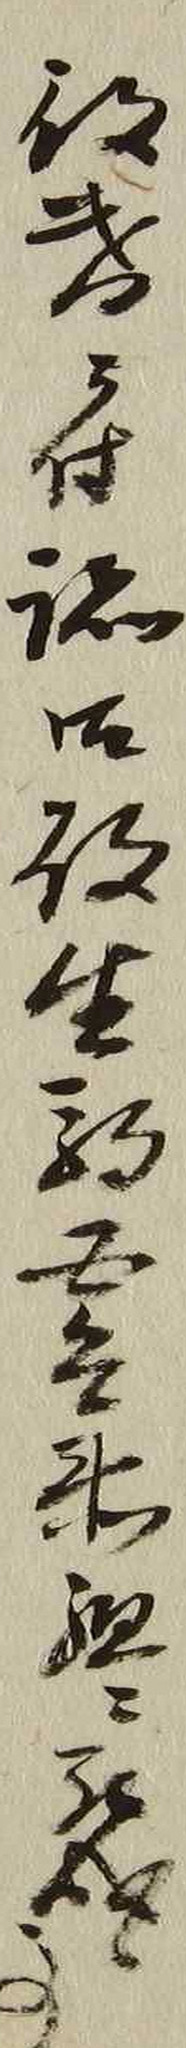役替ニ付跡御役生駒五兵衛組ニ罷成候事
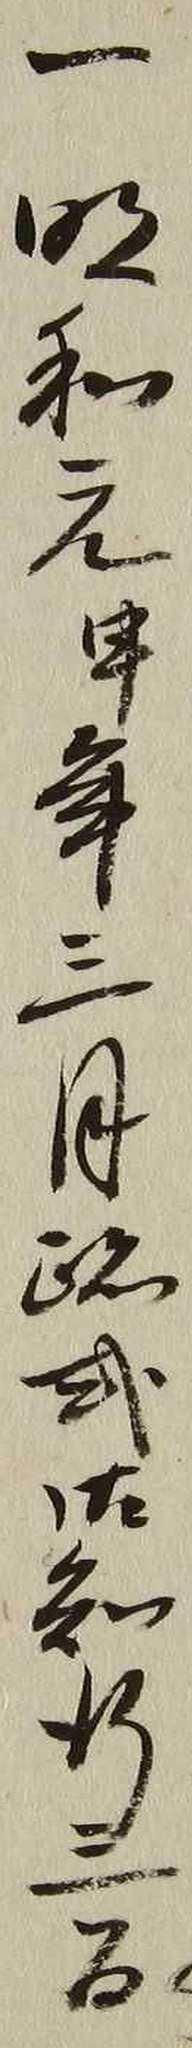一明和元申年三月跡式御知行三百
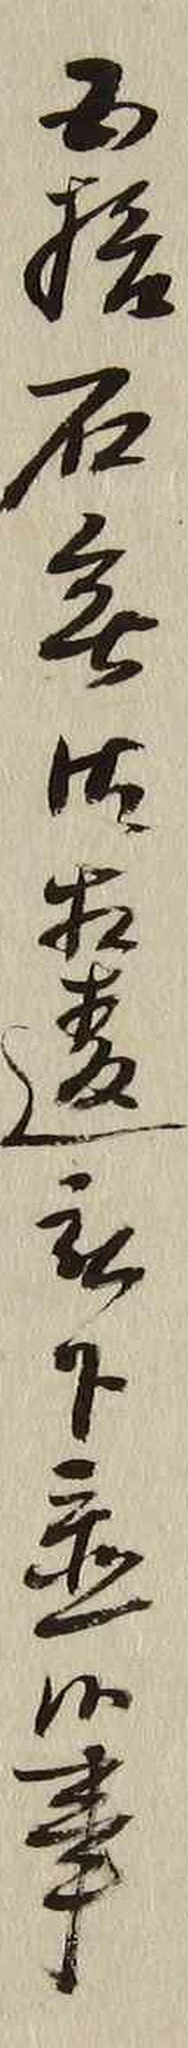五拾石無御相違被下置候事
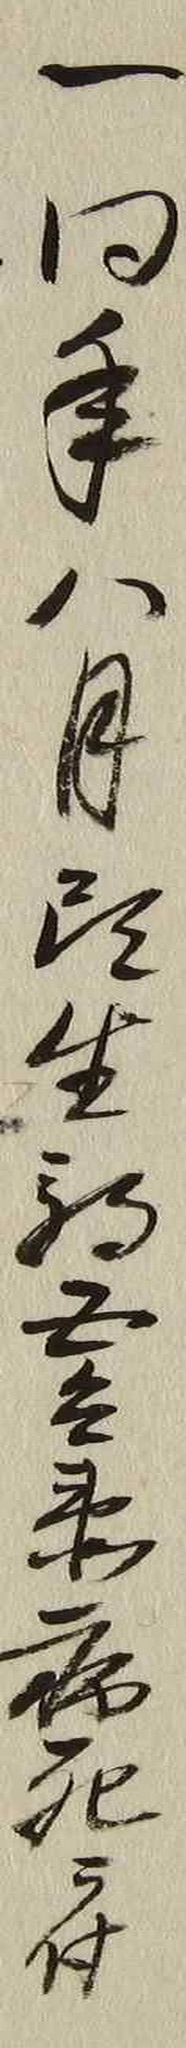一同年八月頭生駒五兵衛病死ニ付
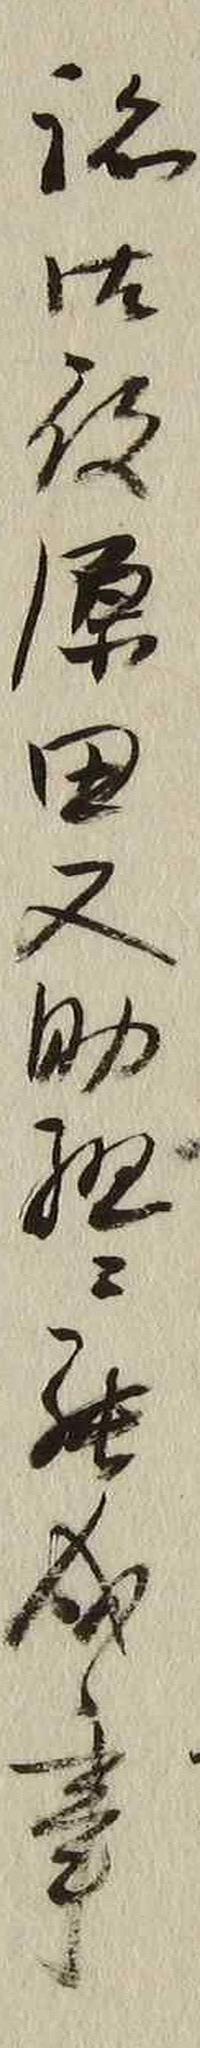跡御役原田又助組ニ罷成候事
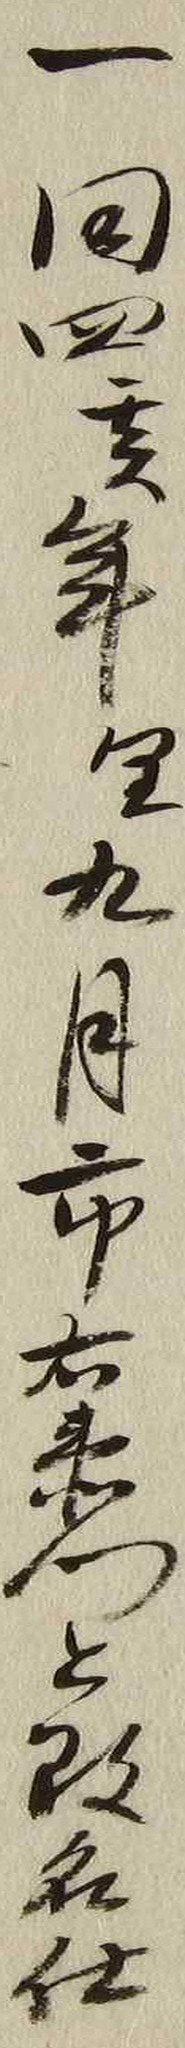一同四亥年閏九月市右衛門と改名仕
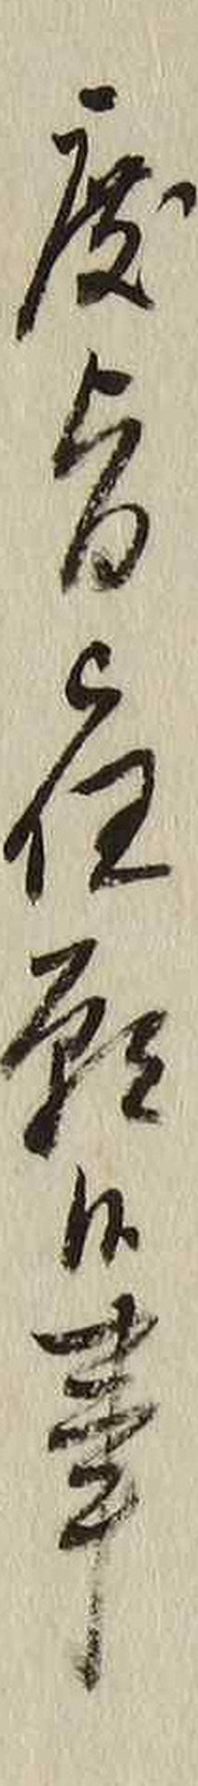度旨被任願候事
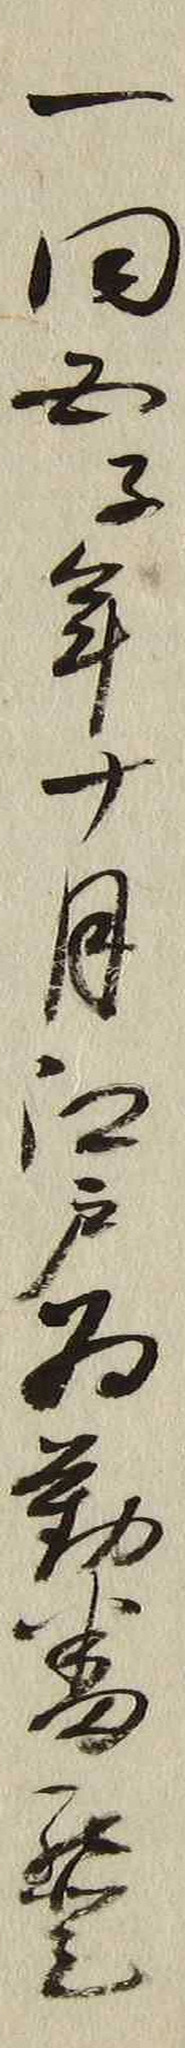一同五子年十月江戸為勤番罷登
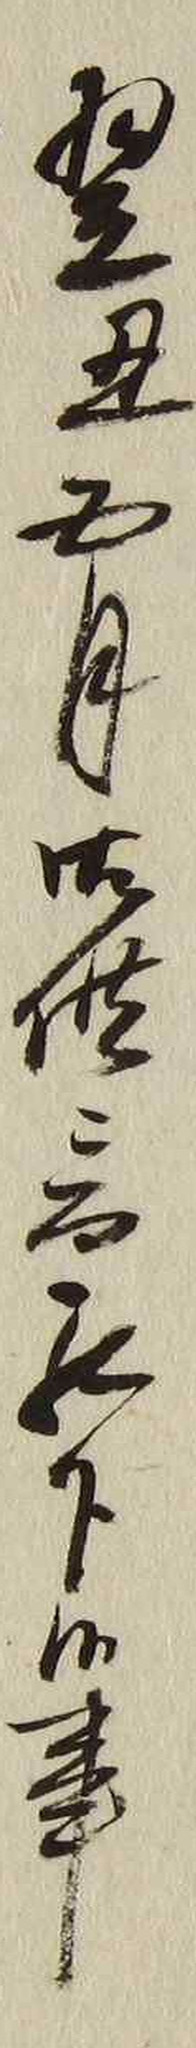翌丑五月御供ニ而罷下候事
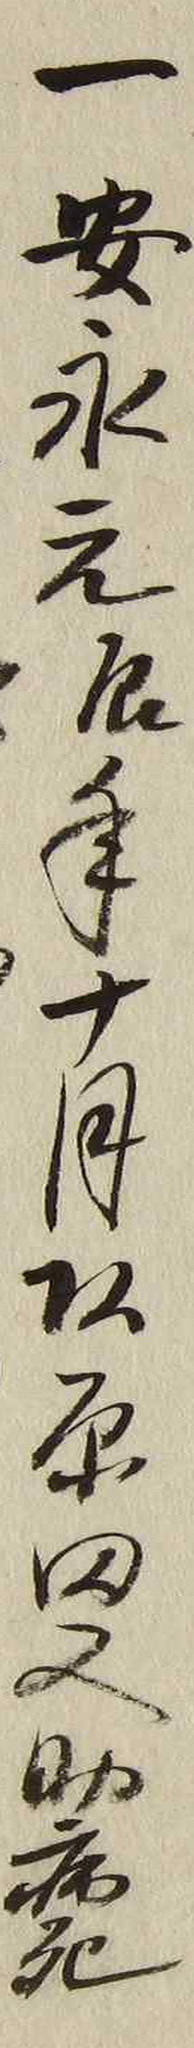一安永元辰年十月頭原田又助病死
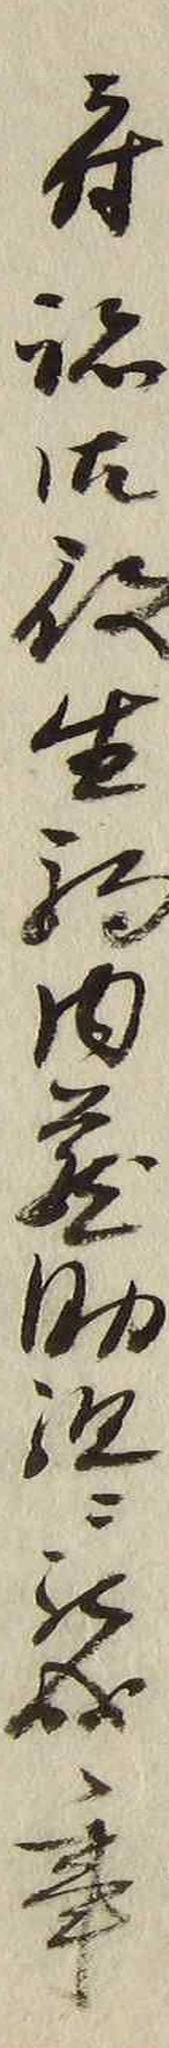ニ付跡御役生駒内蔵助組ニ被成候事
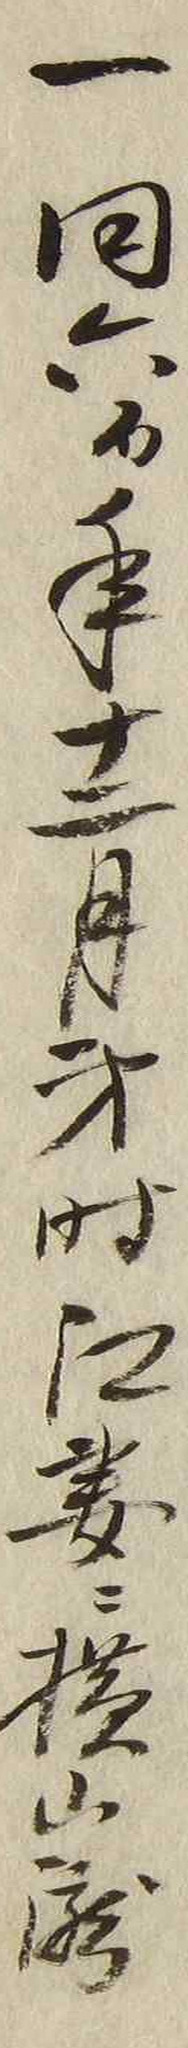一同六酉年十二月弟時江妻ニ横山瀧
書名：諸士系譜　巻之355　す之部5
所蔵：会津若松市立会津図書館
